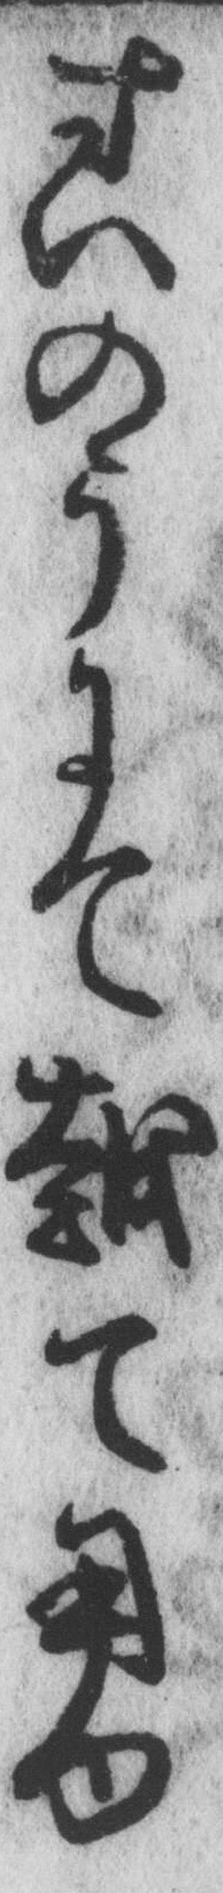すいのうにて越て用ゆ
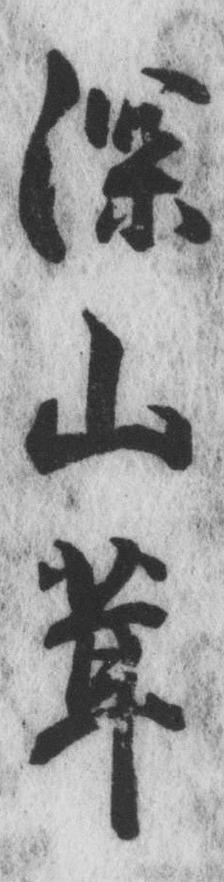深山茸
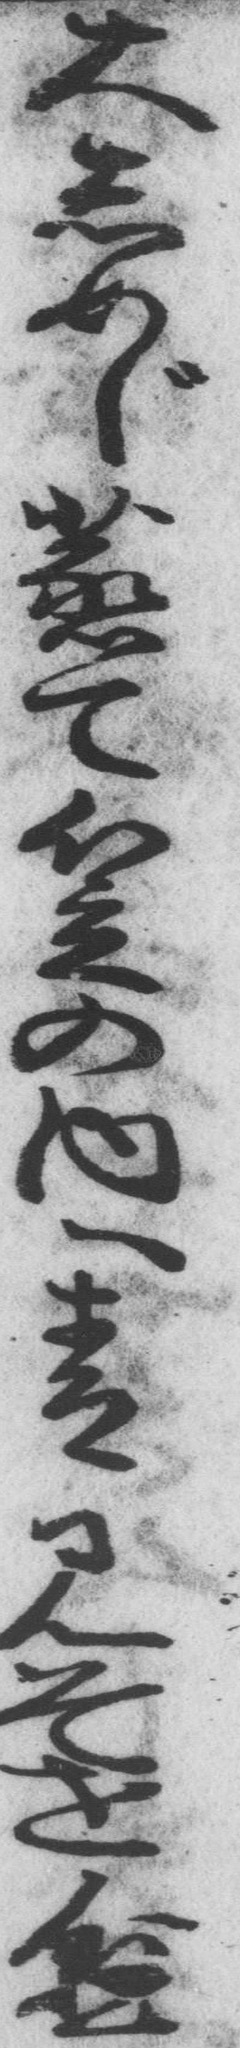大しめじ蒸て笠の内へ麦みそを懸
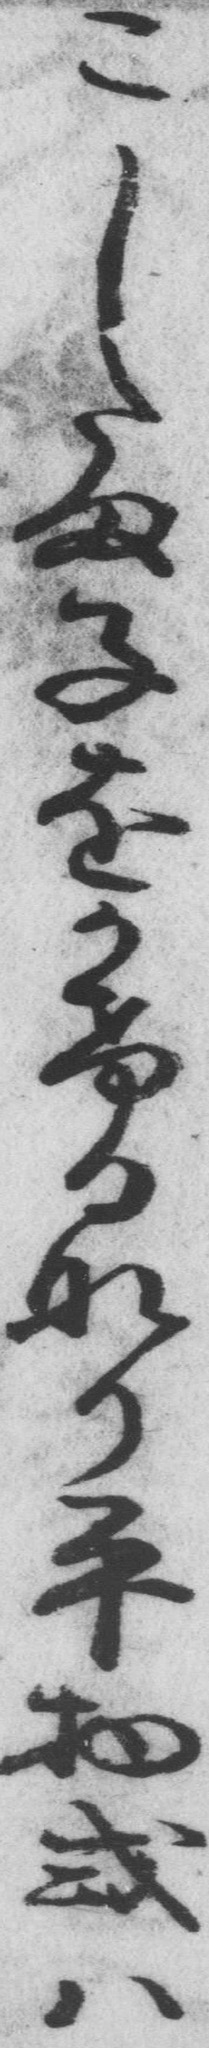こしたま子をうけるなり平物或胃は
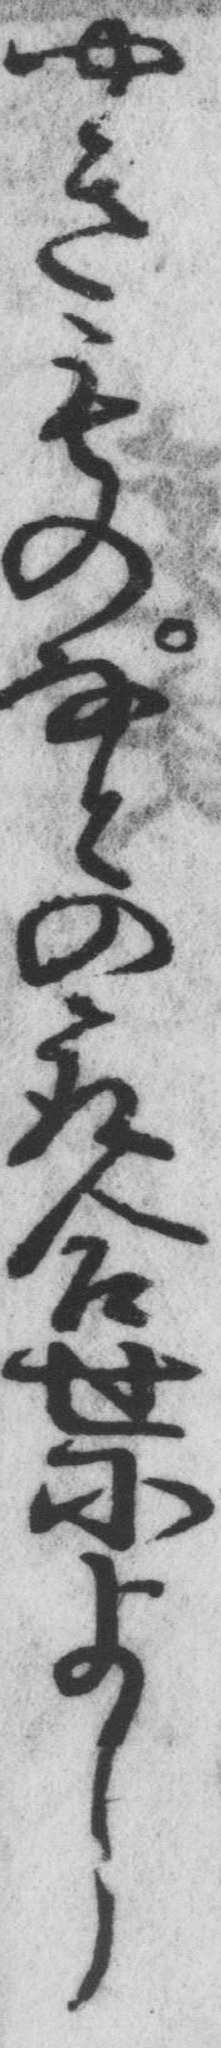やきもの。なとの取合せによし
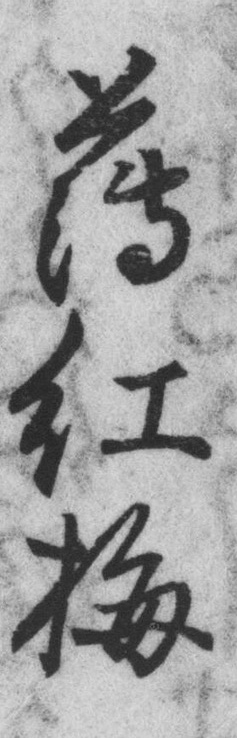薄紅梅
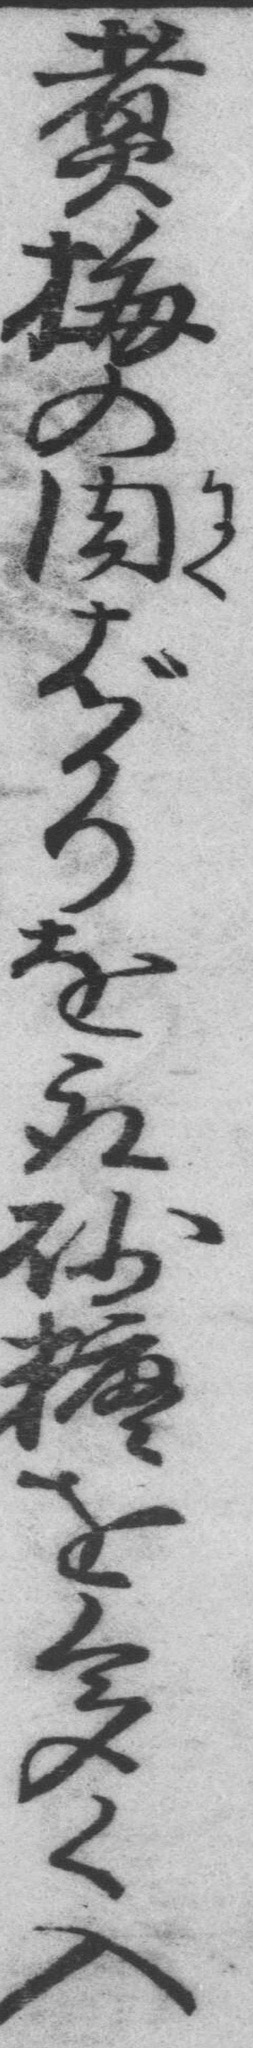煮梅の肉ばかりを取砂糖を多く入
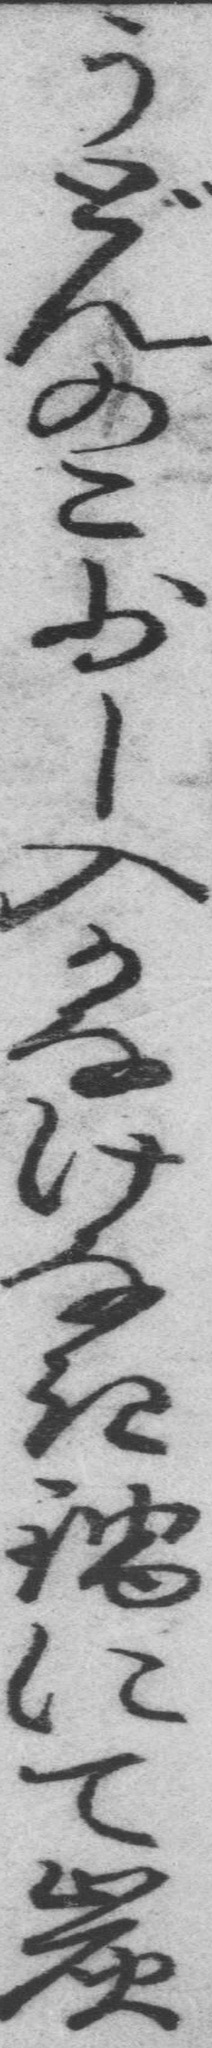うどんのこ少し入かなけなき鍋にて炭
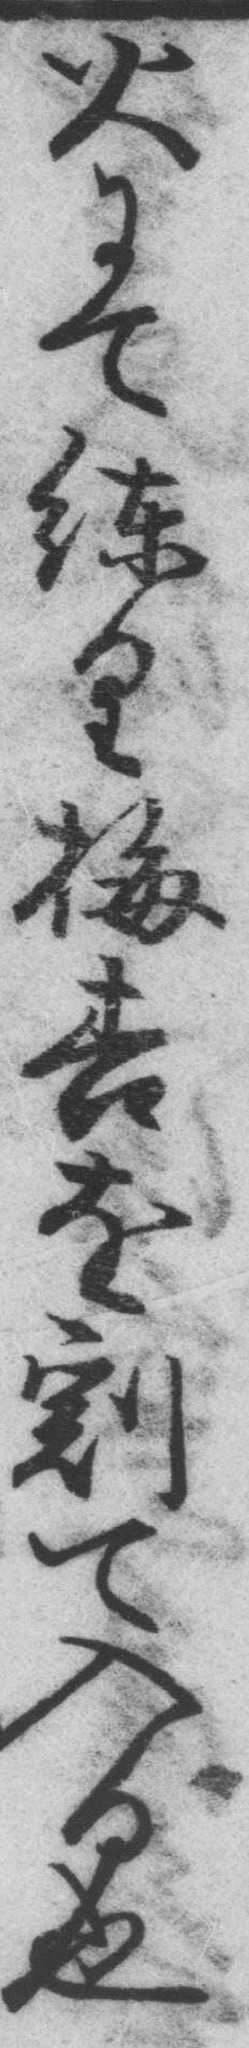火にてねり梅杏を割て入る也
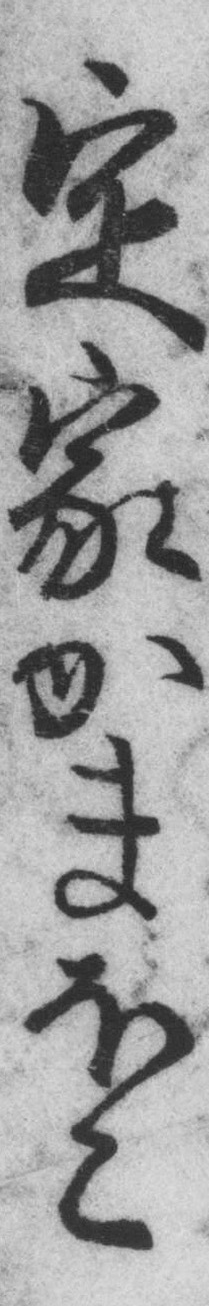定家かまほこ
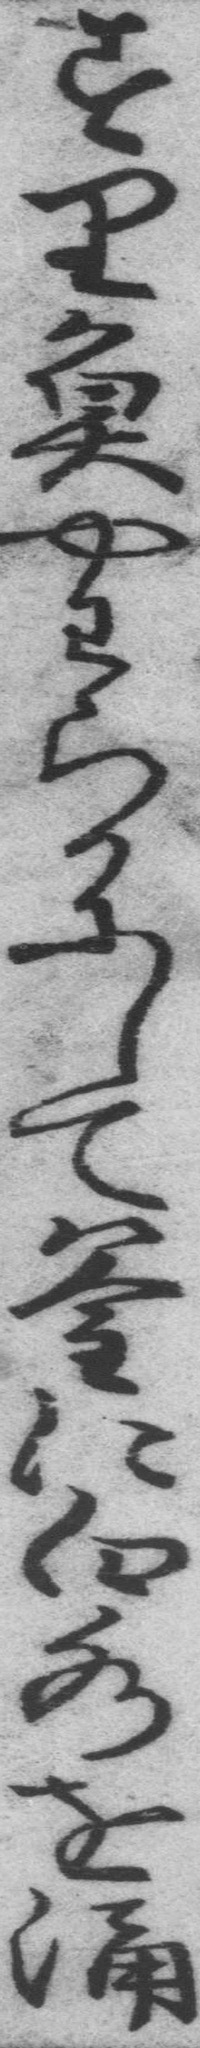すり魚やわらかにして釜に白水を涌
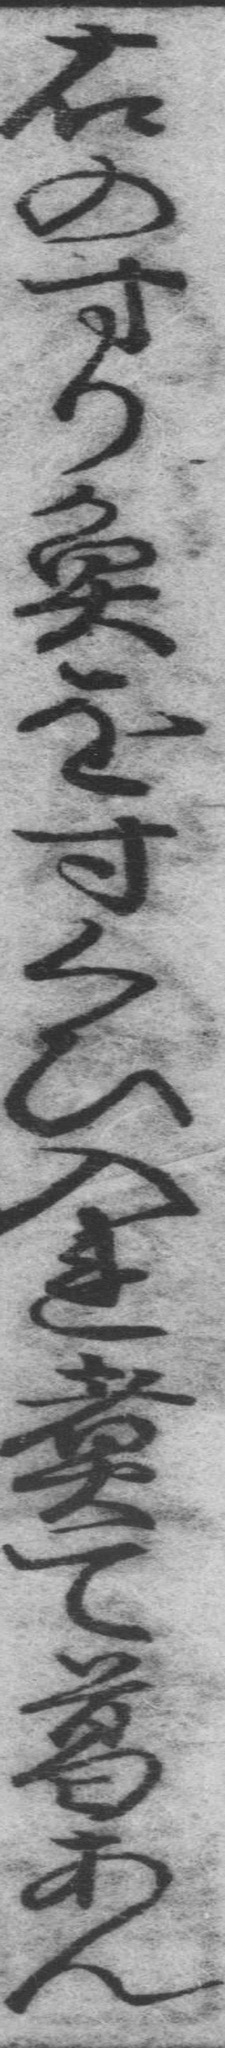右のすり魚をすくひ入れ煮て葛あん

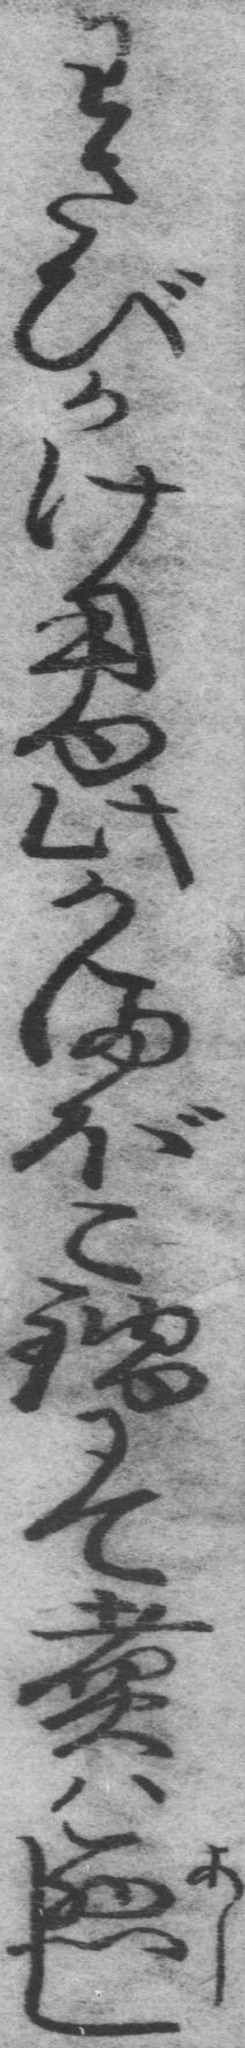わさびかけ用ゆ此かまぼこ鍋にて煮は悪し
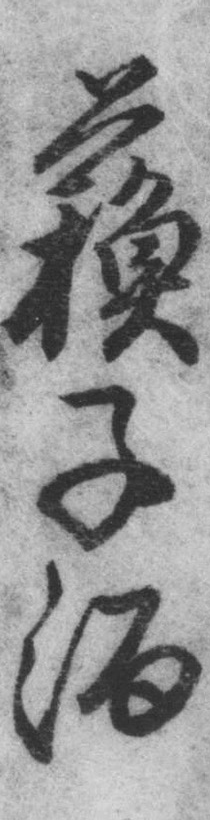蘇子酒
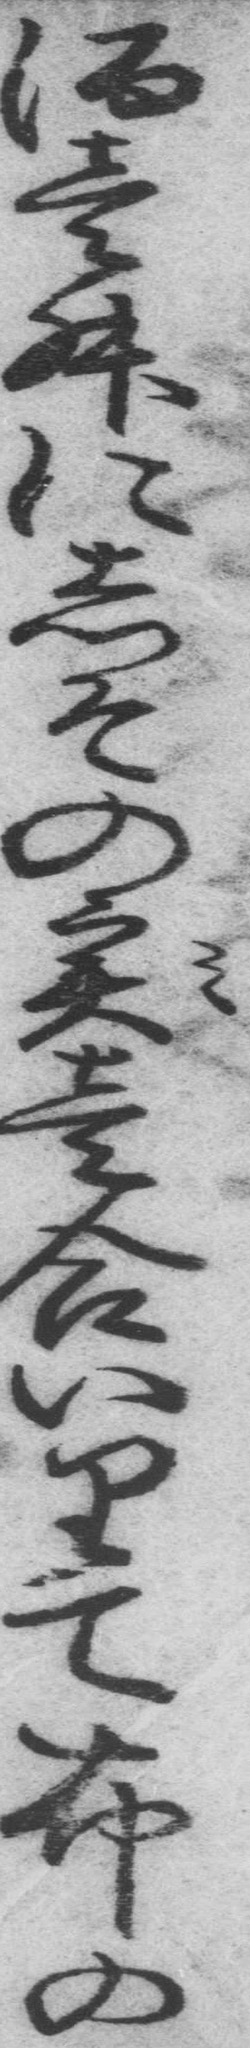酒壱升にしその実壱合いりて布の
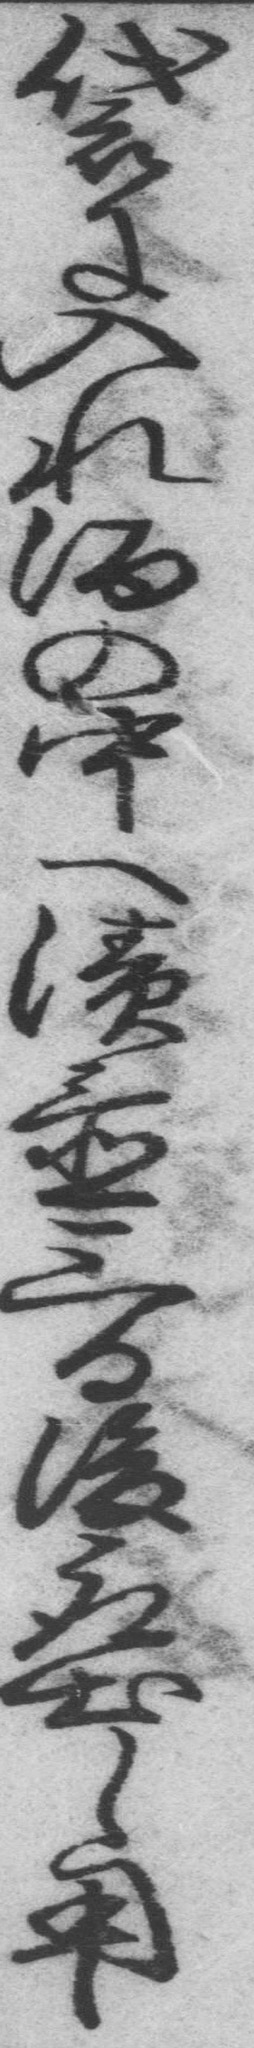袋に入れ酒の中へ漬置三日後取出し用
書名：料理山海郷
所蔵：大阪府立大学学術情報センター 国文学研究資料館
